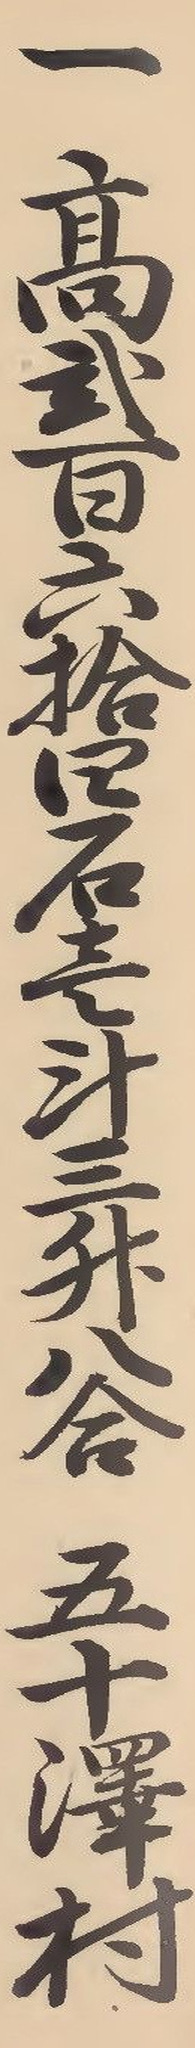一高弐百六拾四石壱斗三升八合五十沢村
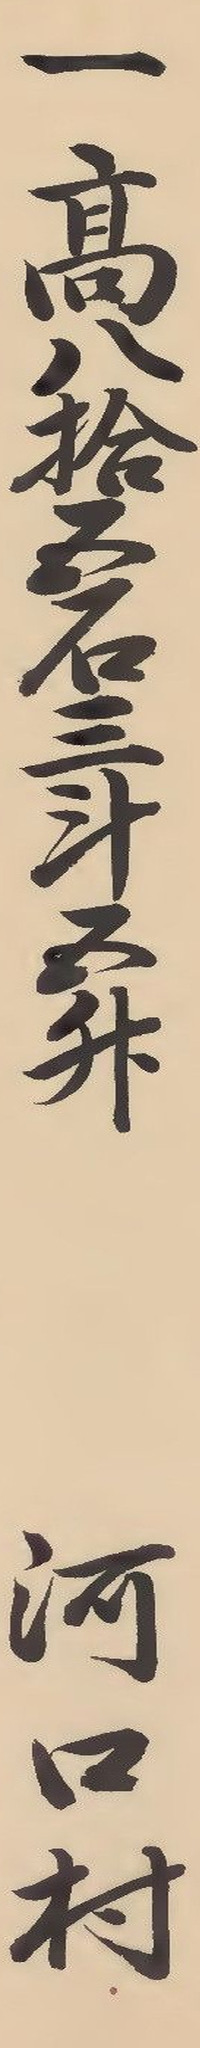一高八拾五石三斗五升河口村
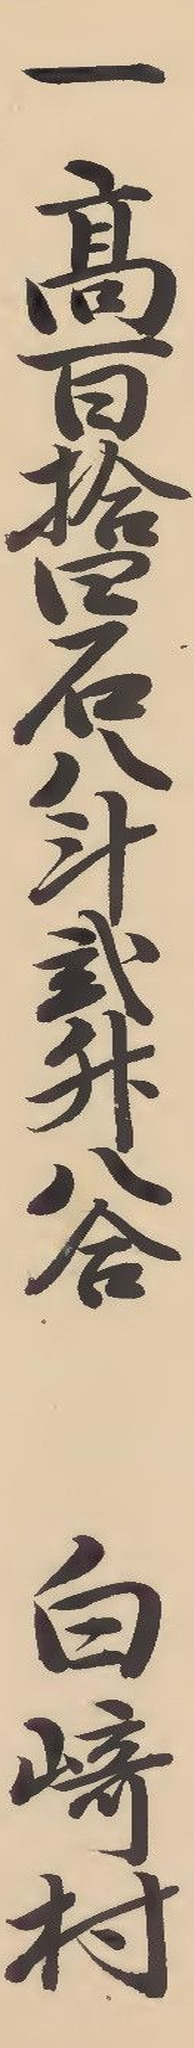一高百拾四石八斗弐升八合白崎村
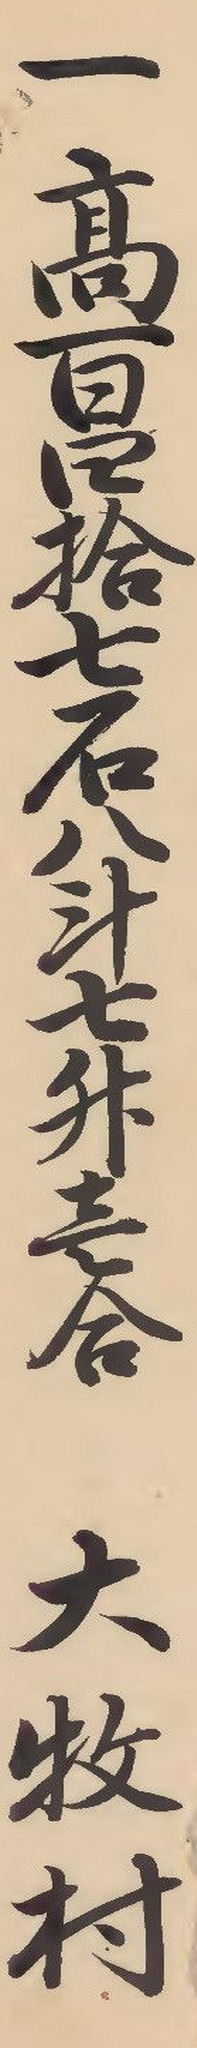一高百四拾七石八斗七升壱合大牧村

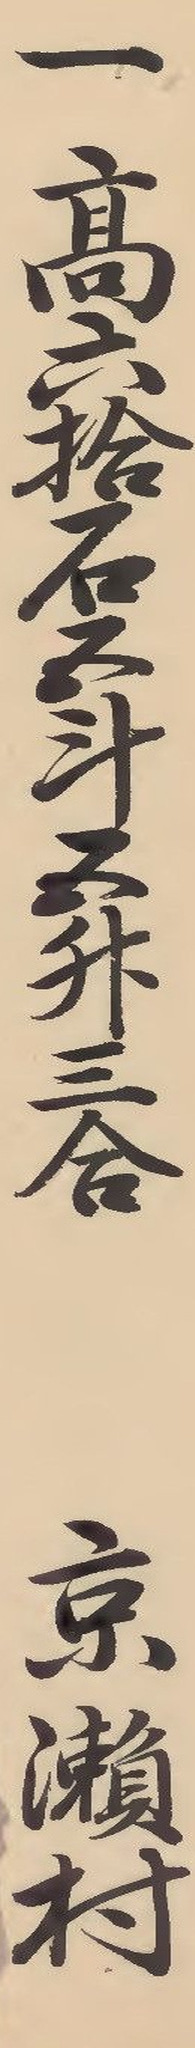一高六拾石五斗五升三合京瀬村
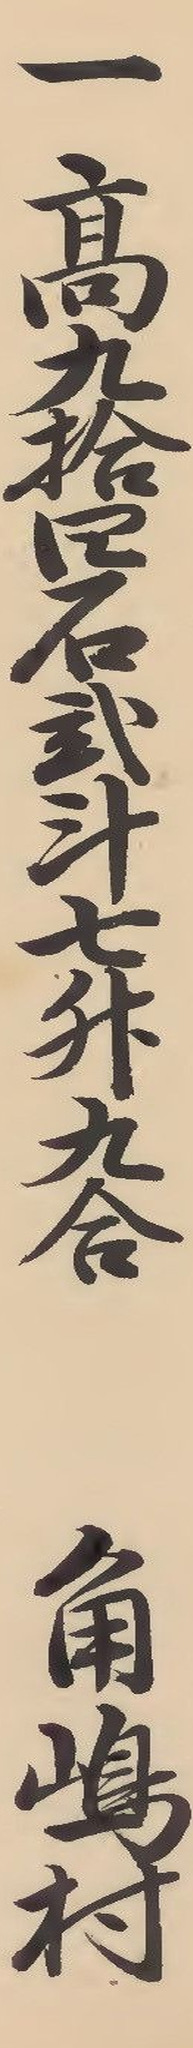一高九拾四石弐斗七升九合角島村
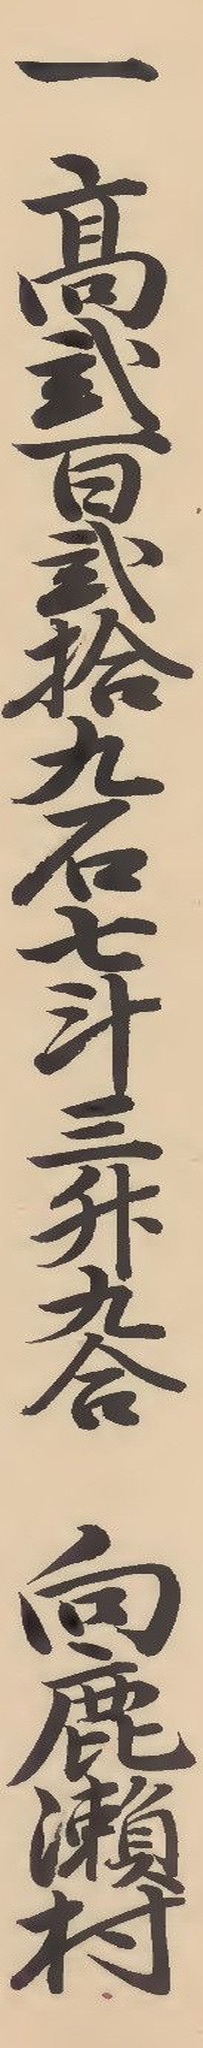一高弐百弐拾九石七斗三升九合向鹿瀬村
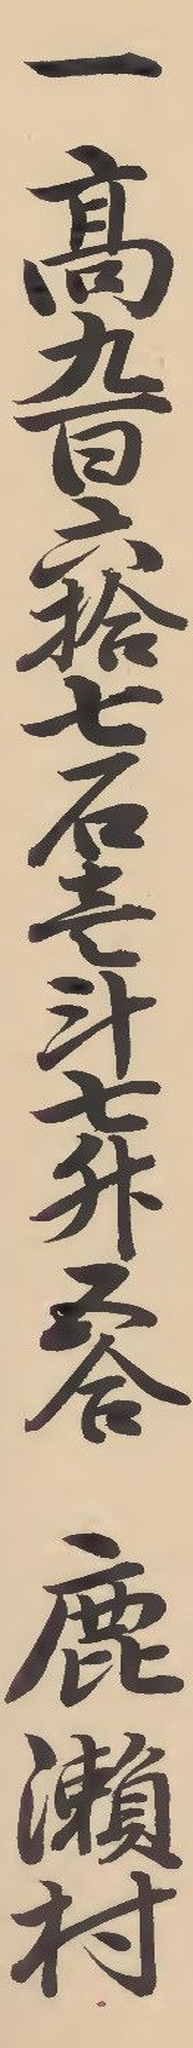一高九百六拾七石壱斗七升五合鹿瀬村
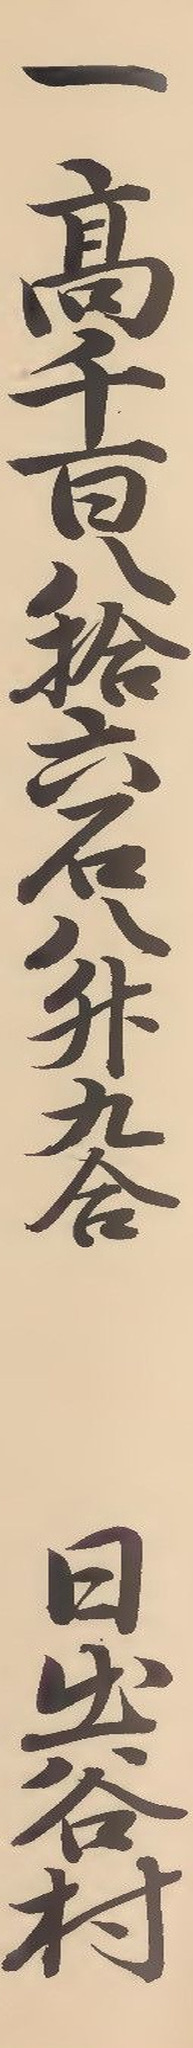一高千百八拾六石八升九合日出谷村
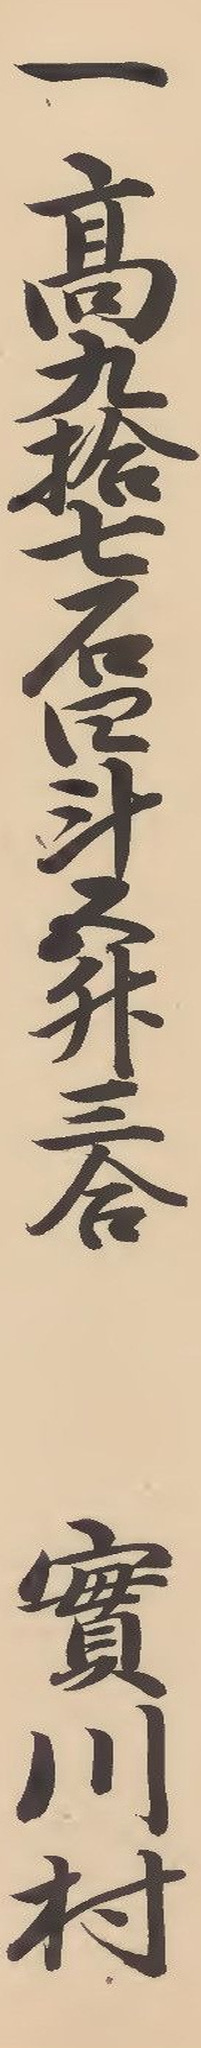一高九拾七石四斗五升三合実川村
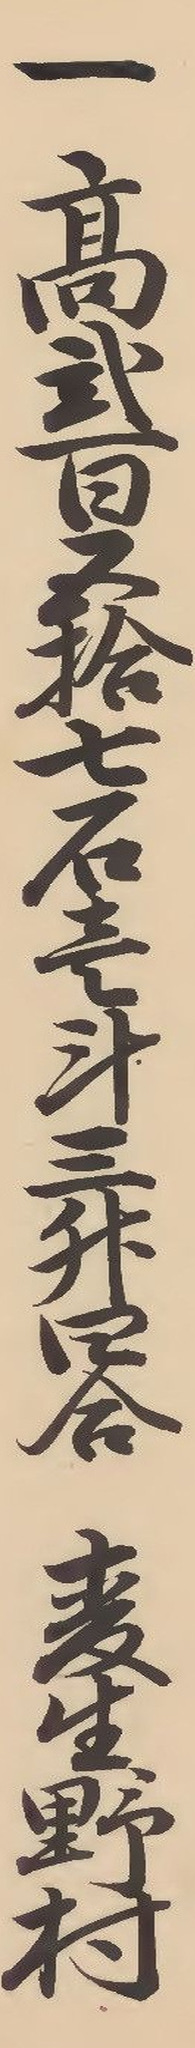一高弐百五拾七石壱斗三升四合麦生野村
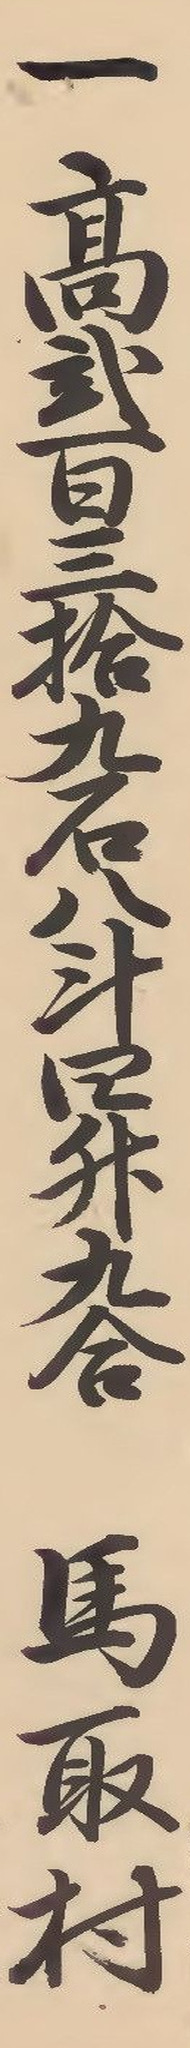一高弐百三拾九石八斗四升九合馬取村

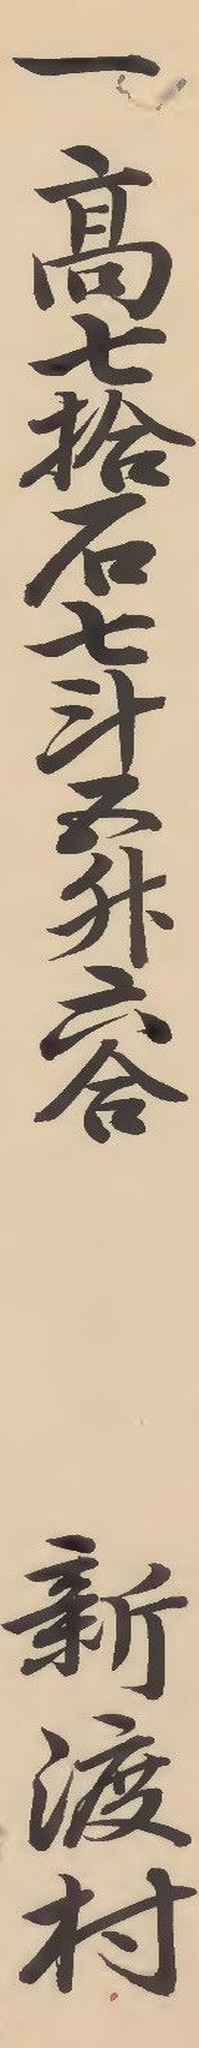一高七拾石七斗五升六合新渡村
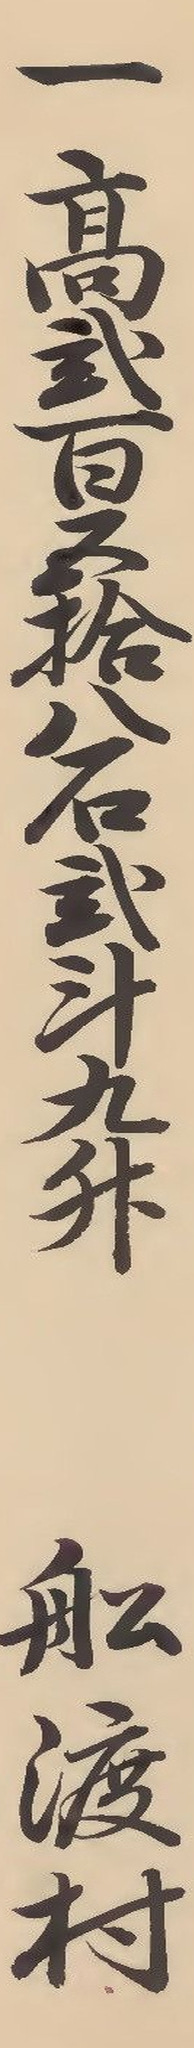一高弐百五拾八石弐斗九升船渡村
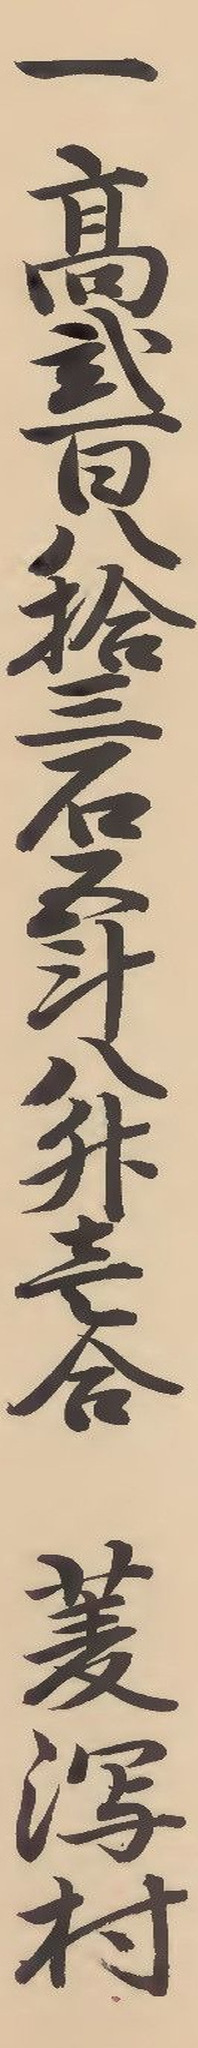一高弐百八拾三石五斗八升壱合菱潟村
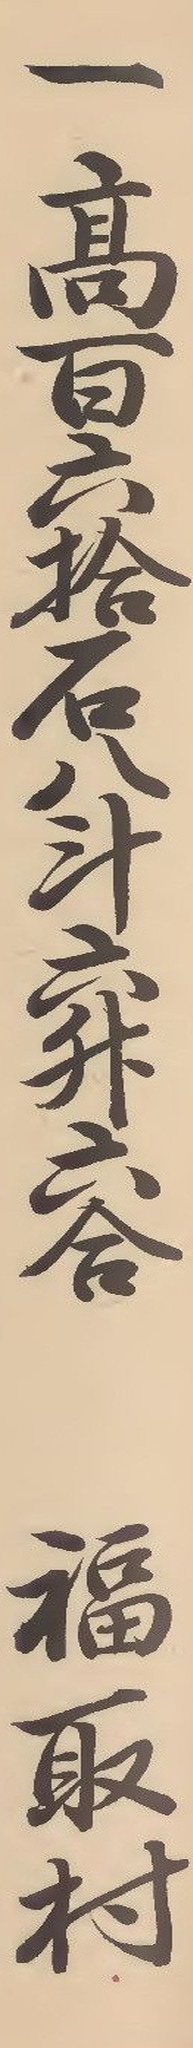一高百六拾石八斗六升六合福取村
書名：越後国郷帳　下
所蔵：国立公文書館 National Archives of Japan
